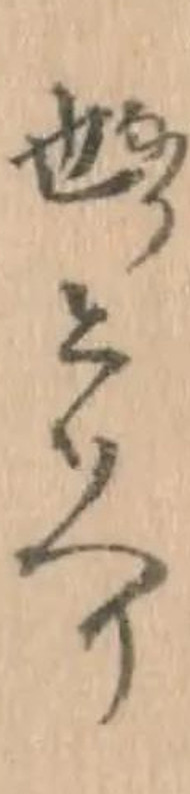也といへり
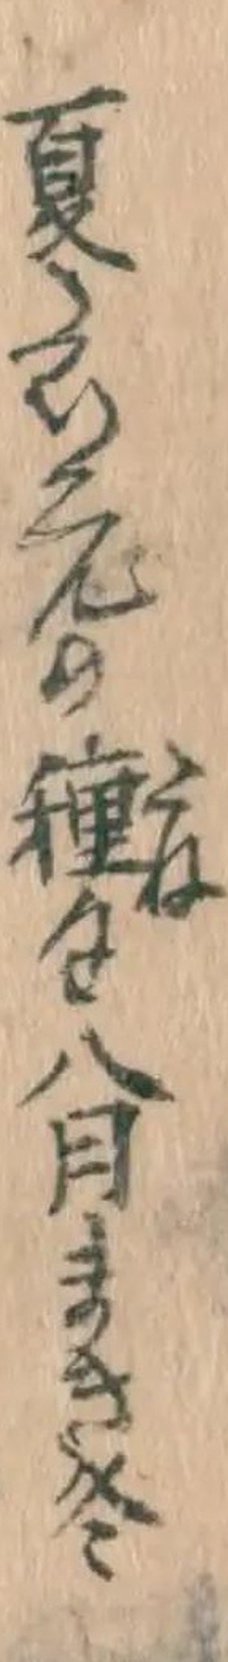夏たいこんの種を八月まき冬
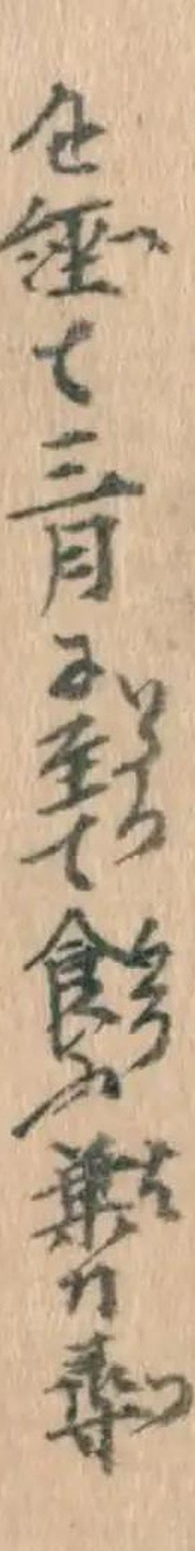を経て三月に至て食ふ葉は尋
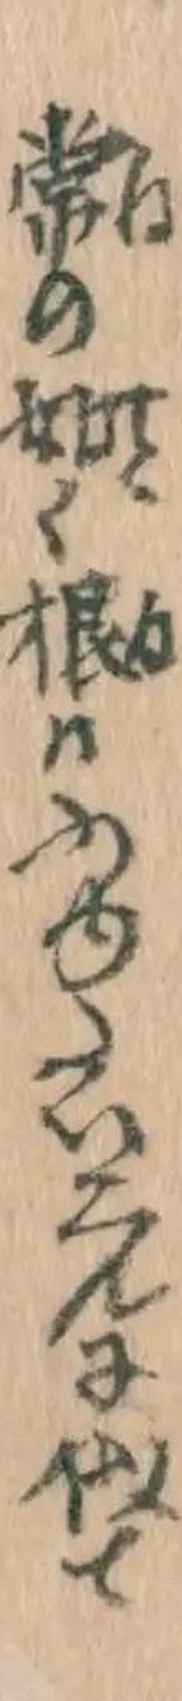常の如く根はふゆたいこんに似て
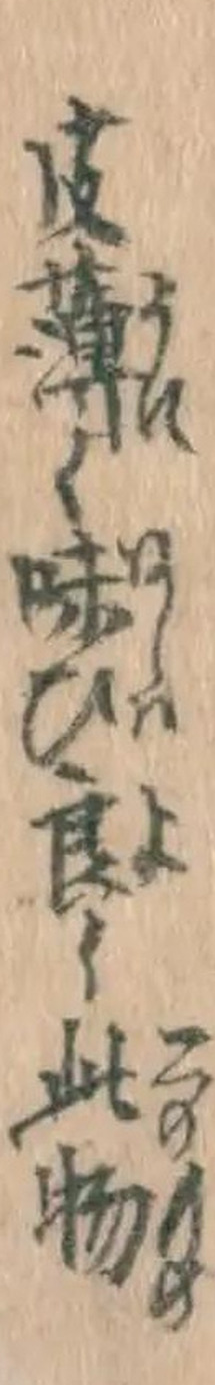皮薄く味ひ良し此物
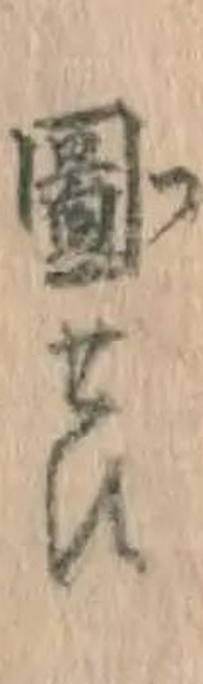図せす
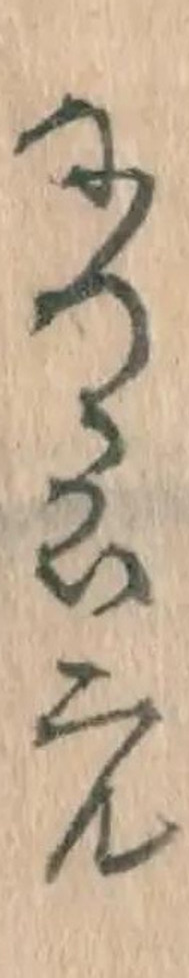なつたいこん
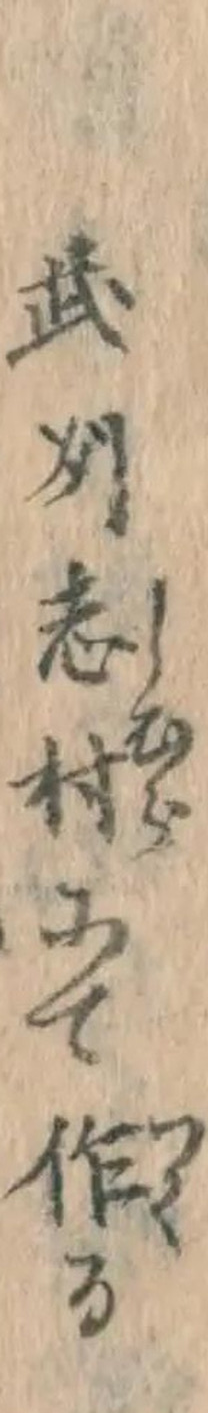武州志村にて作る

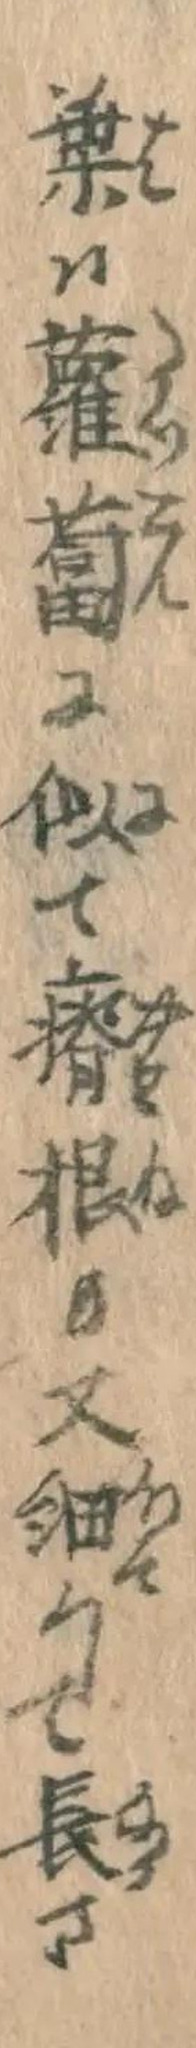葉は蘿蔔に似て瘠根も又細くして長さ
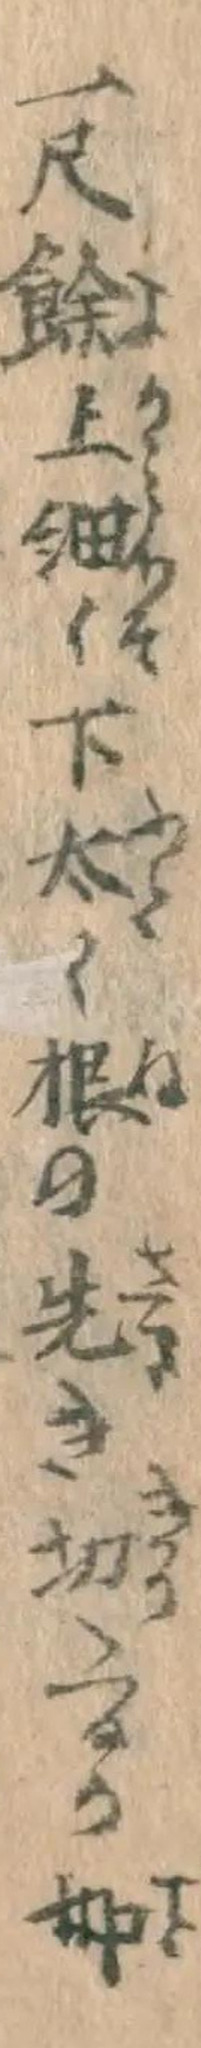一尺余上細く下太く根の先き切たるか如
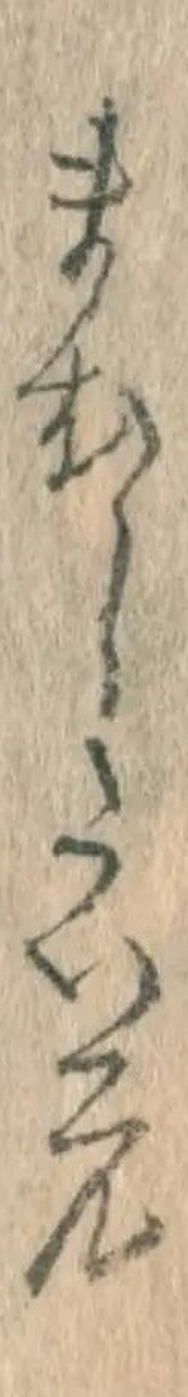まむしたいこん
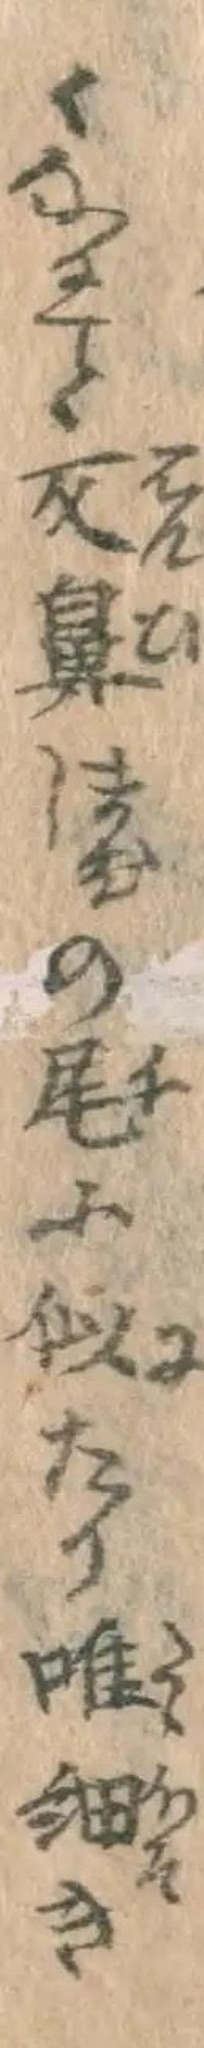くなること反鼻まむしの尾に似たり唯細き
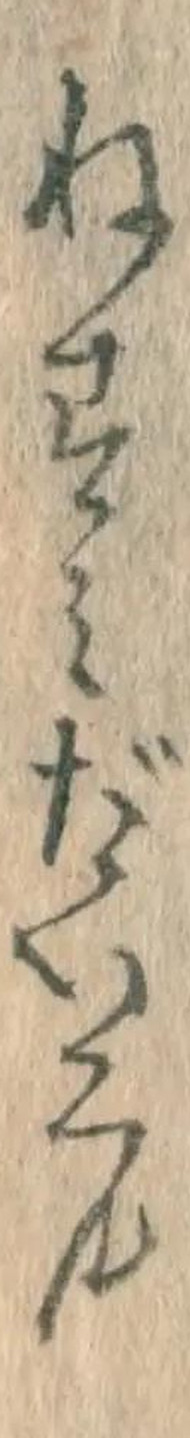ねすみだいこん
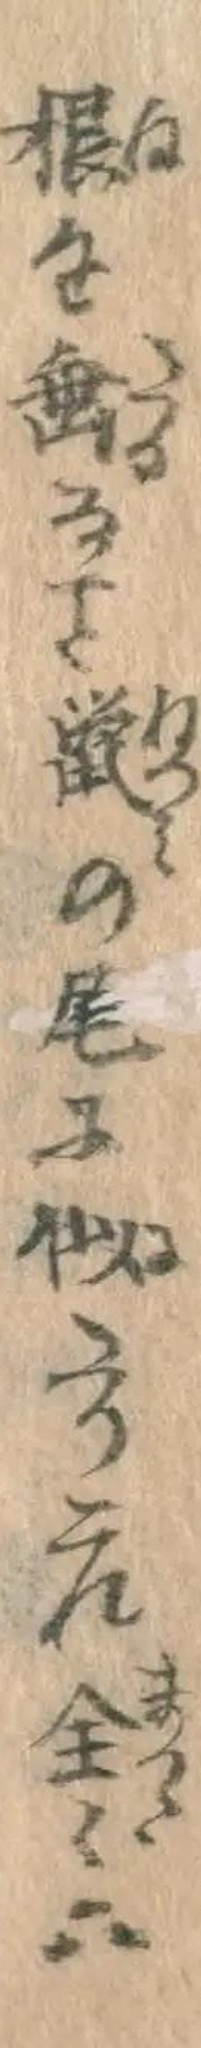根を垂ること鼠の尾に似たりこれ全く∴
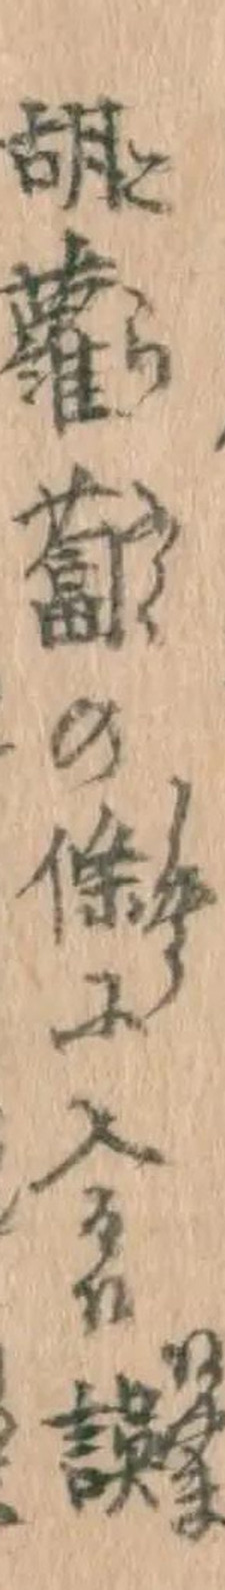胡蘿蔔の条に入るは誤
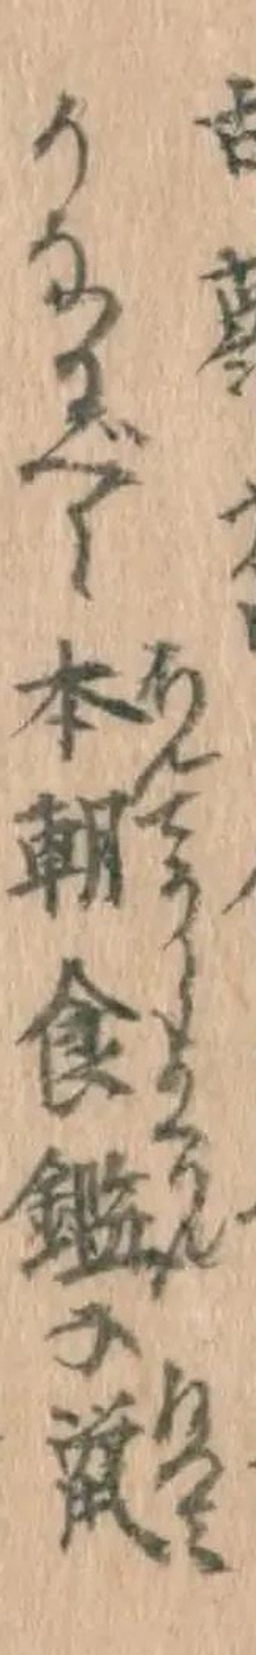りなるべし本朝食鑑に鼠
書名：本草図譜. 巻46-48
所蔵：国立国会図書館 National Diet Library, JAPAN
